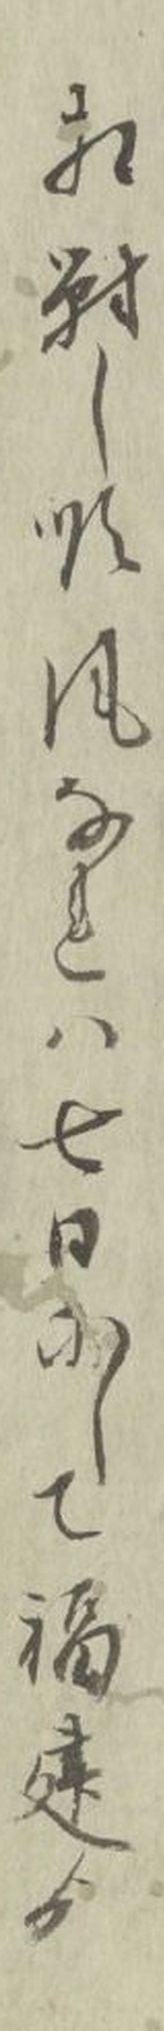相対し順風なれは七日にして福建ゟ
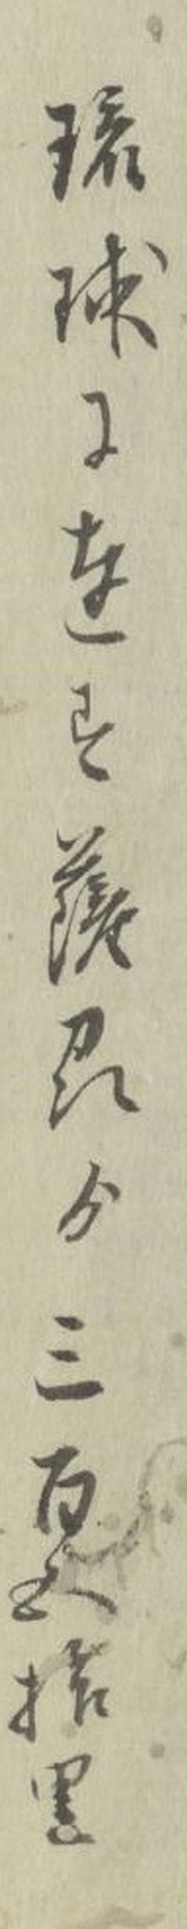琉球に達す薩州ゟ三百五拾里
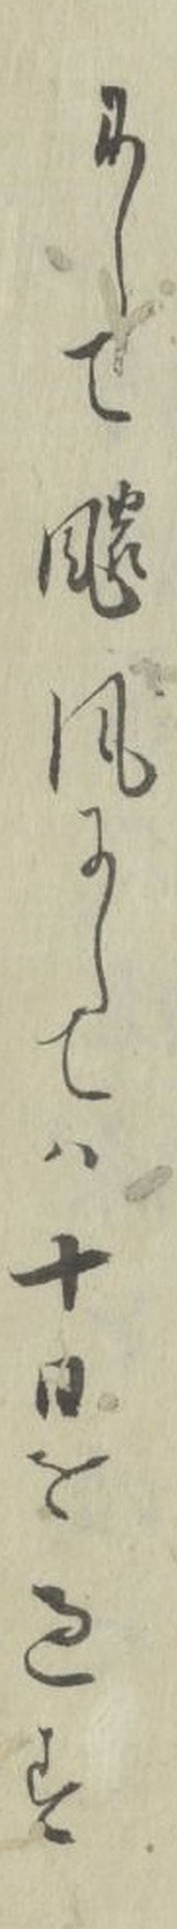にして飈風にしては十日を過す
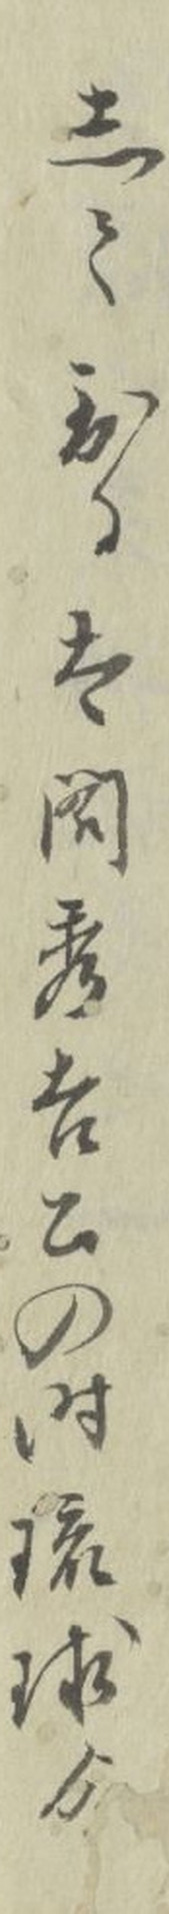して至る太閤秀吉公の時琉球ゟ
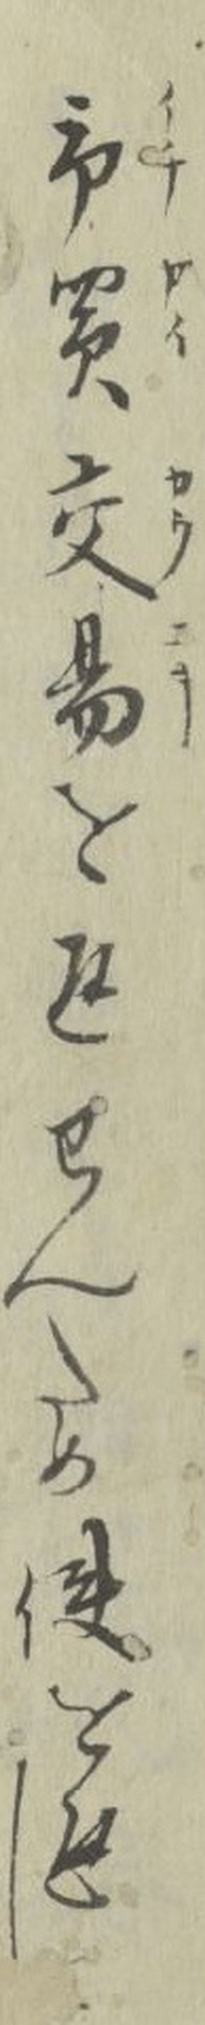市買交易を通せんため使を通し
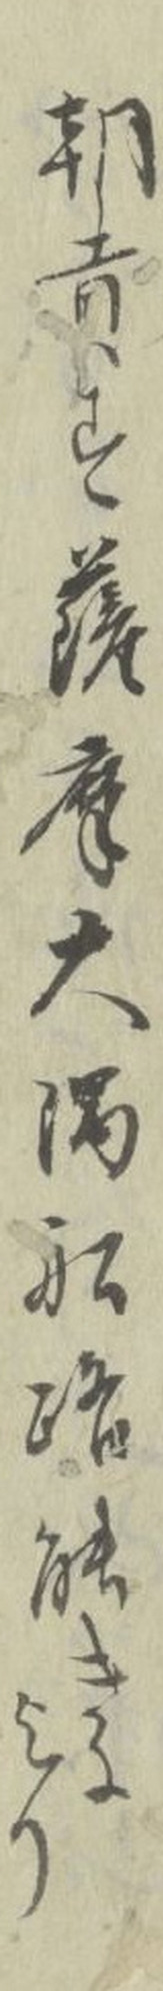朝貢す薩摩大隅船路能きにより
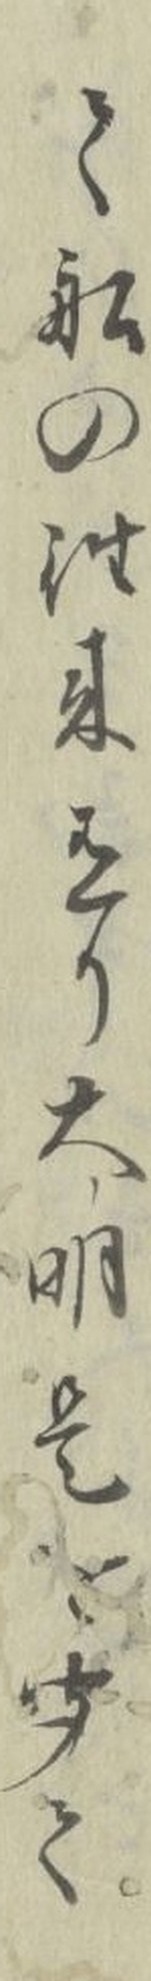て船の往来有り大-明是を聞て
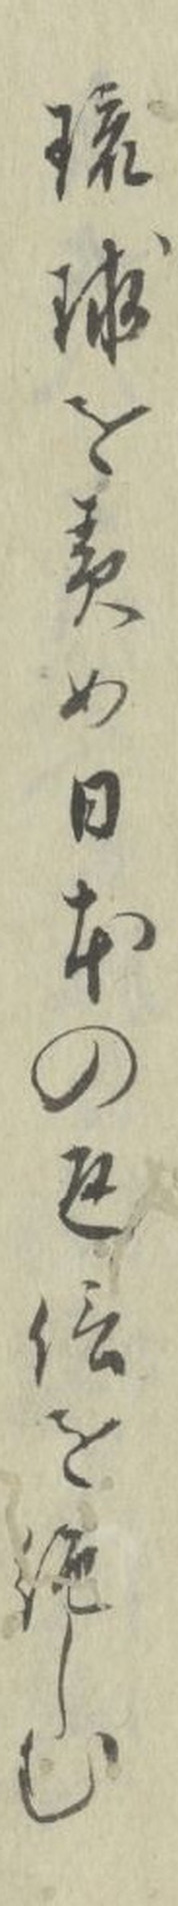琉球を責め日本の通信を絶しむ
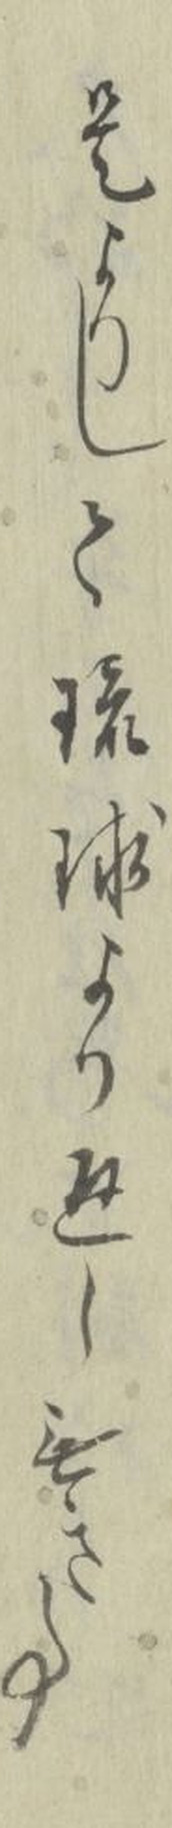是よりして琉球より通し無き事
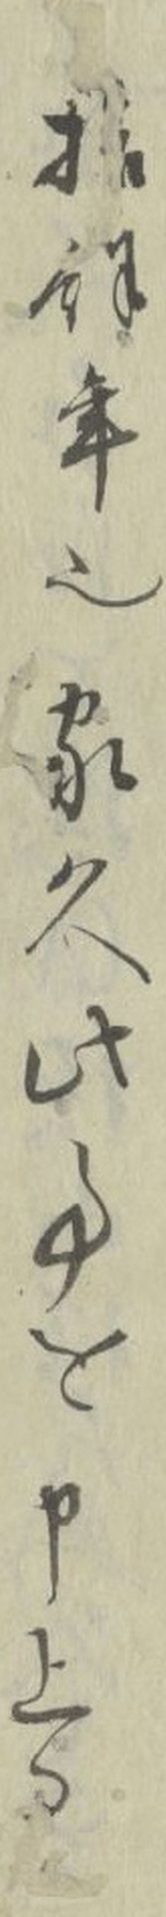拾余年也家久此事を申上る

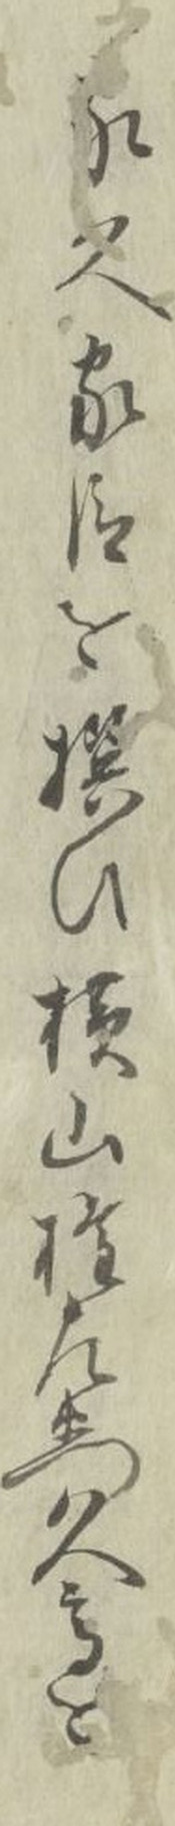家久家臣を撰ひ横山権左衛門久高を
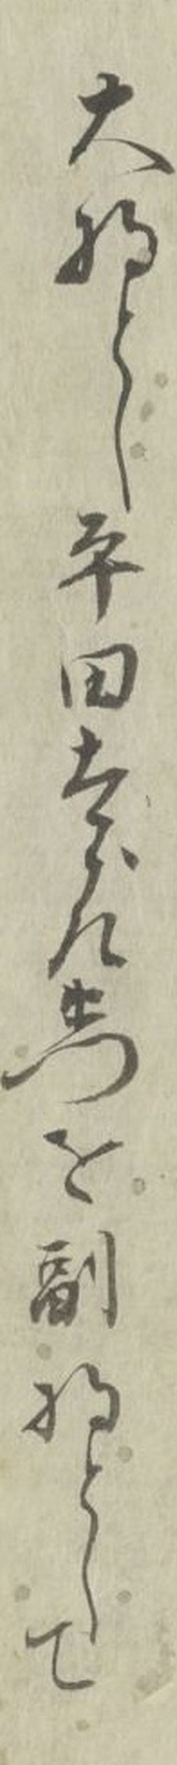大将とし平田太郎左衛門を副将として
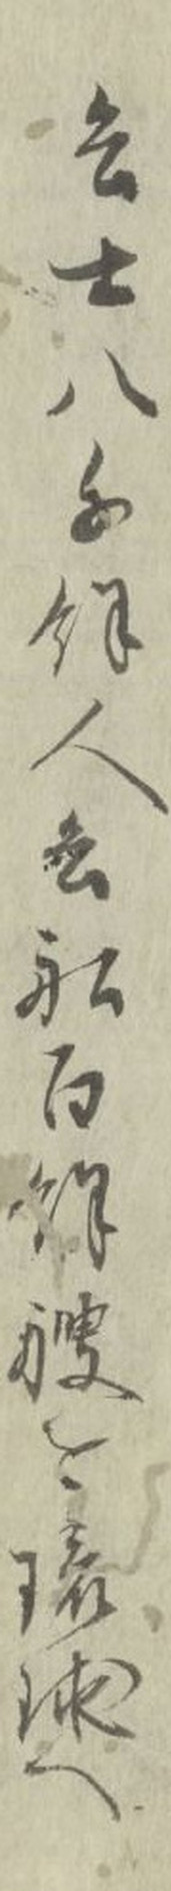兵士八千余人兵船百余艘を琉球へ
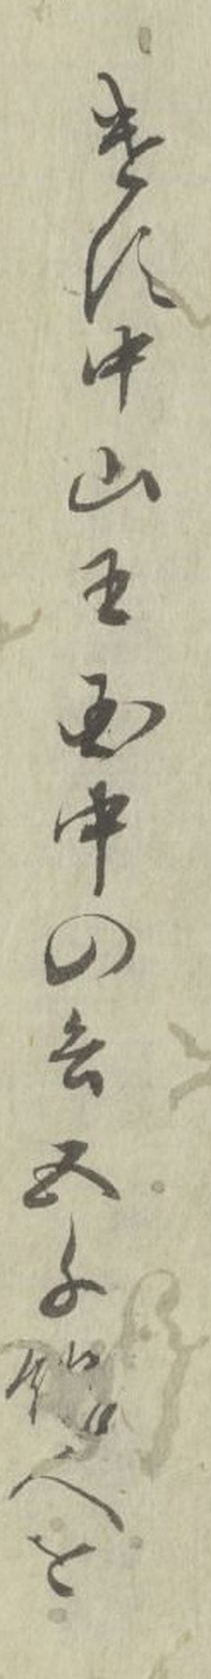遣す中山王国中の兵五千余人を
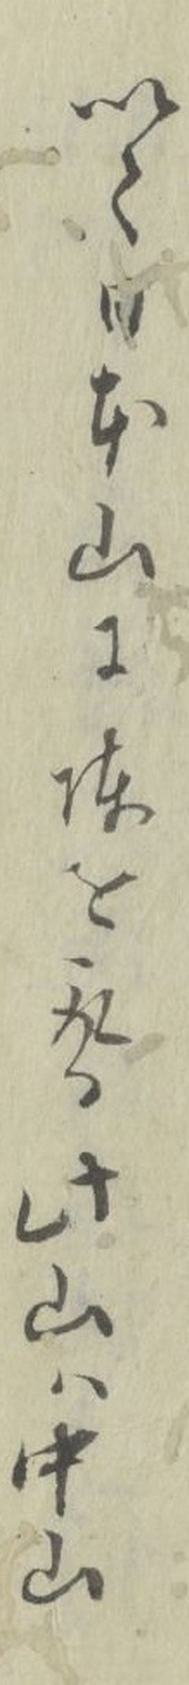以て日本山に陣を取る此山は中山
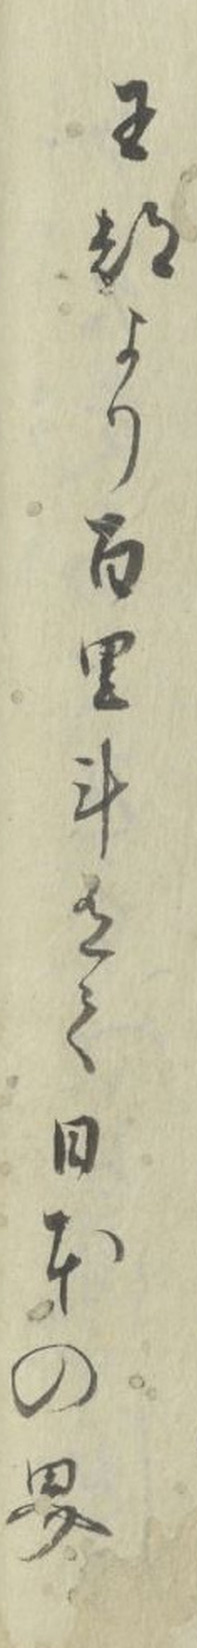王都より百里計有て日本の界
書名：琉球来朝記 自一至七
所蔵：University of the Ryukyus Library
